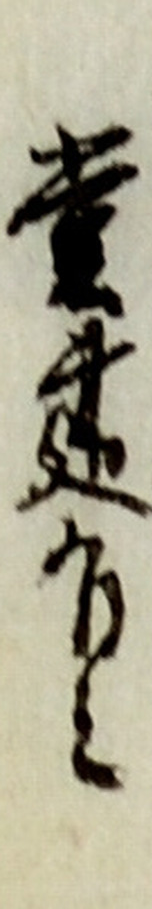堂建有之
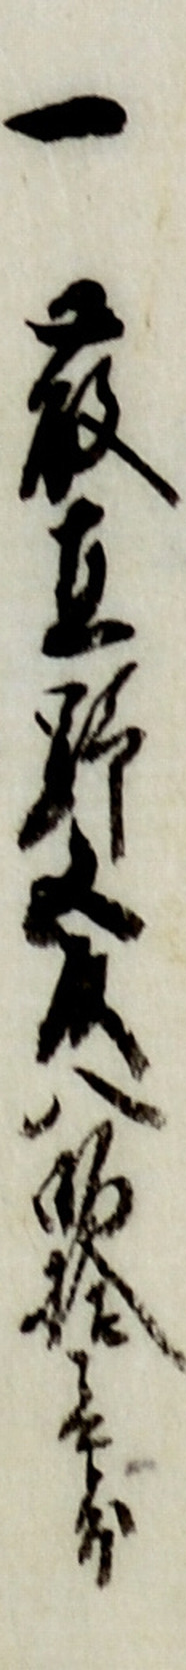一散在野五反八畝拾壱歩

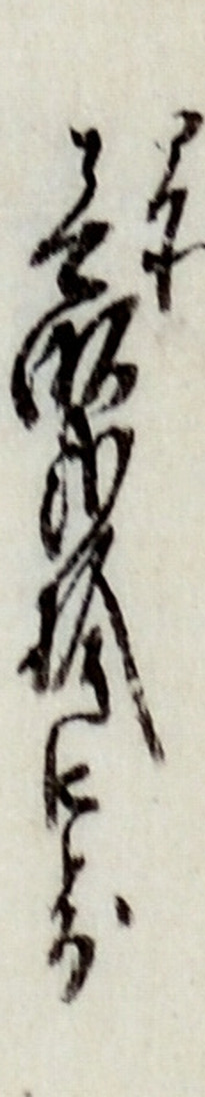壱畝弐拾四歩吉平
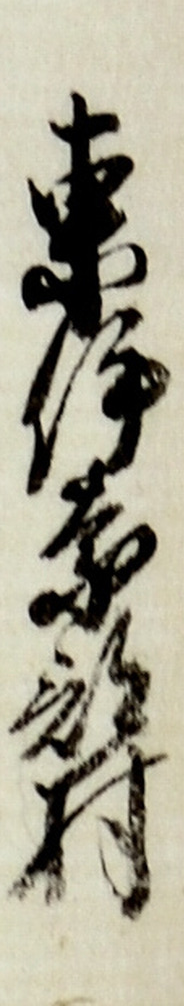東伊奈部村
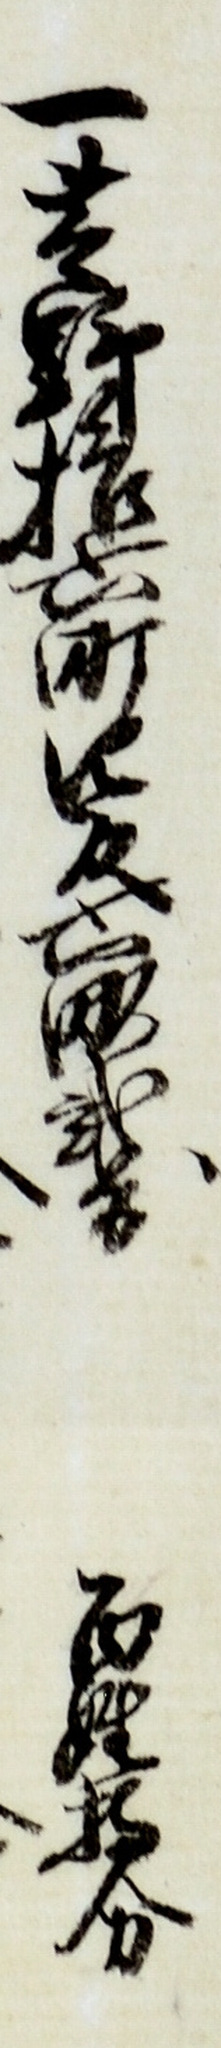一芝野拾六町四反六畝弐歩百姓持分
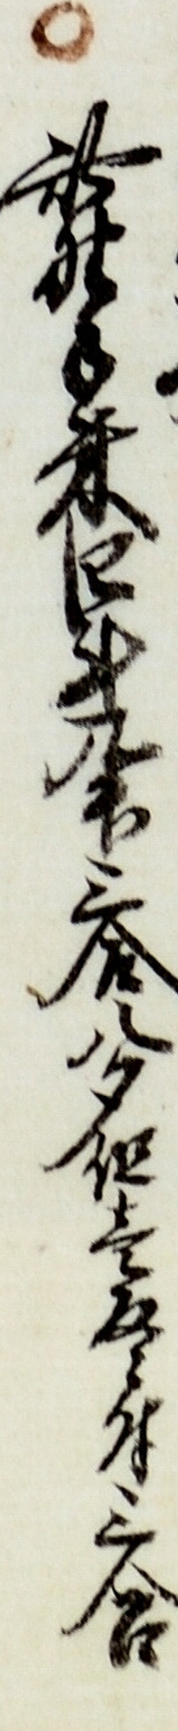○此野手米四斗九升三合八勺但壱反ニ付三合
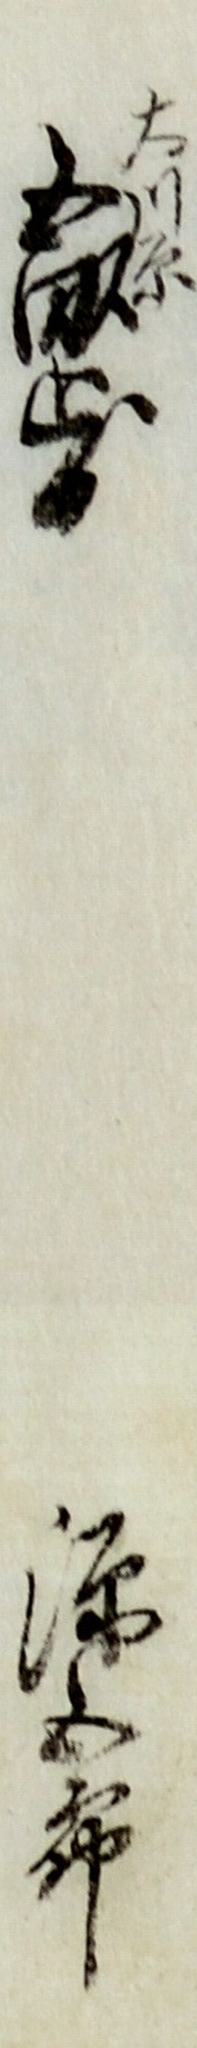五畝歩源五郎

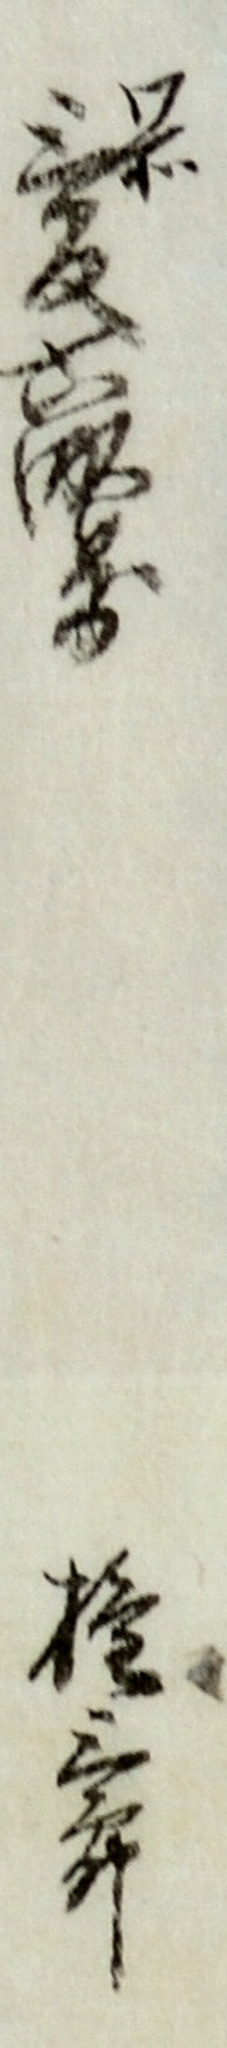三反六畝歩権三郎
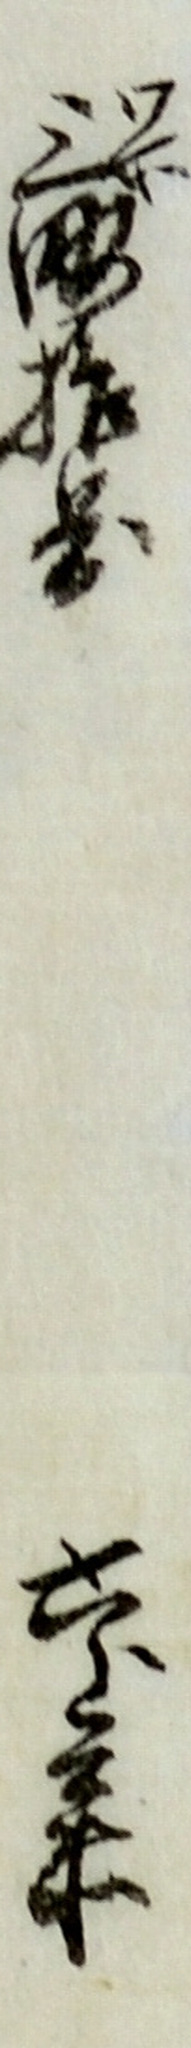三畝拾歩六郎兵衛
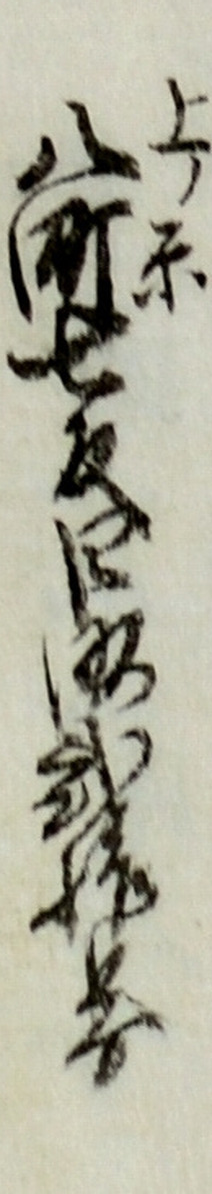八町七反四畝弐拾歩村中
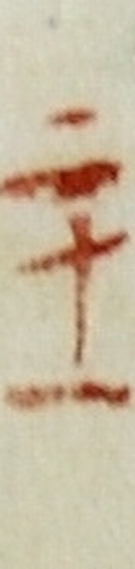二十一

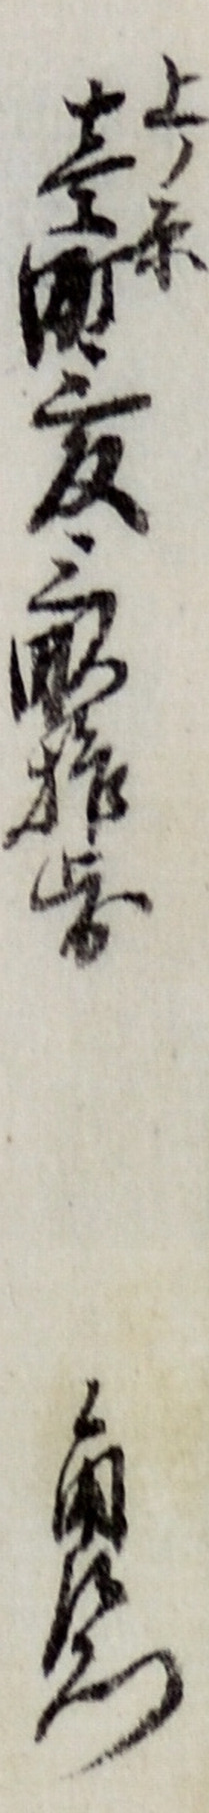壱町三反三畝拾歩角左衛門
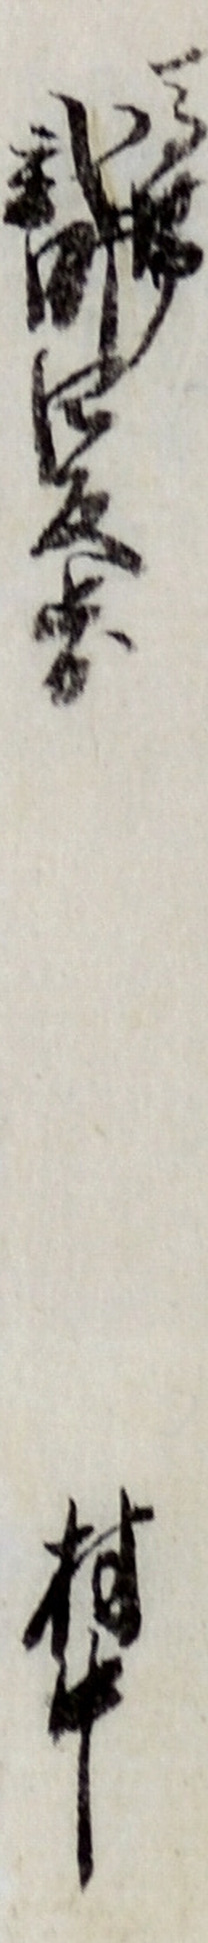弐町四反歩村中
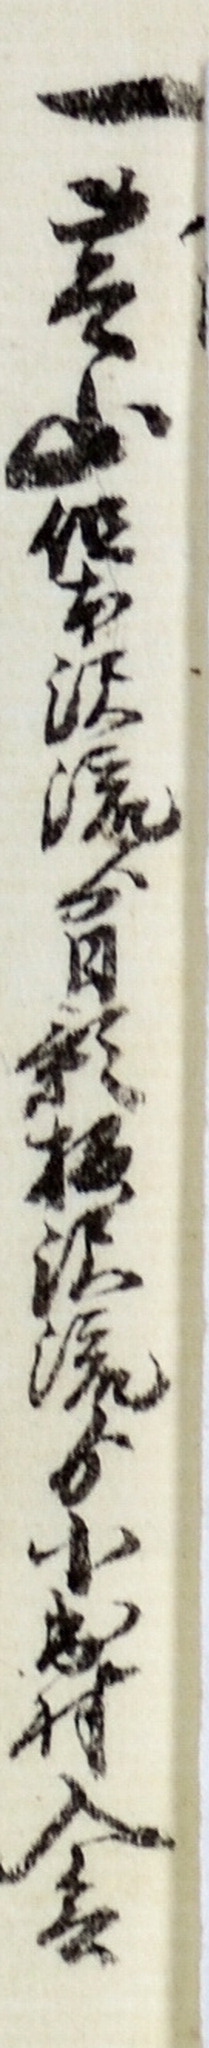一芝山但本沢流より日影板沢流より小出村入会
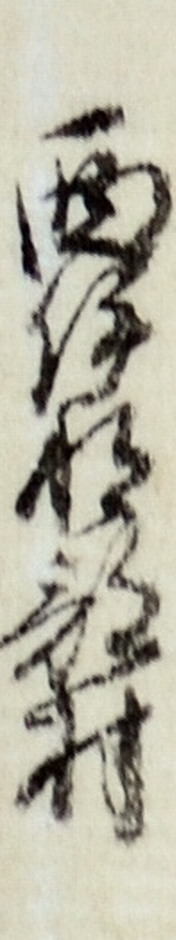西伊那部村
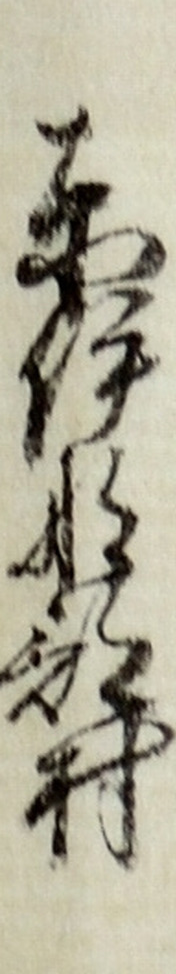西伊那部村
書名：御領分中山林社地手控
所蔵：伊那市立高遠町図書館・合同会社AMANE
